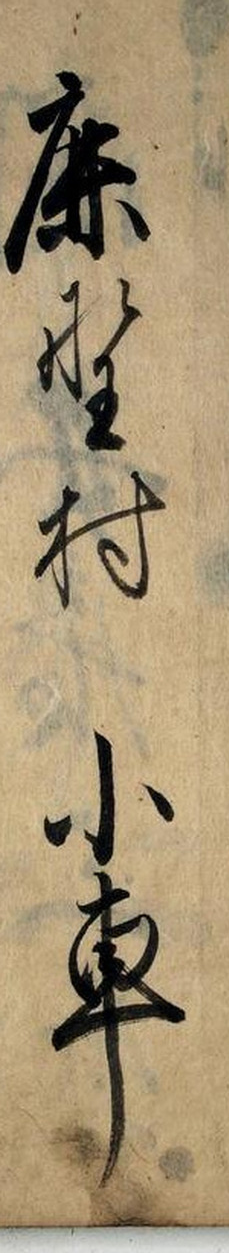鹿野村小車
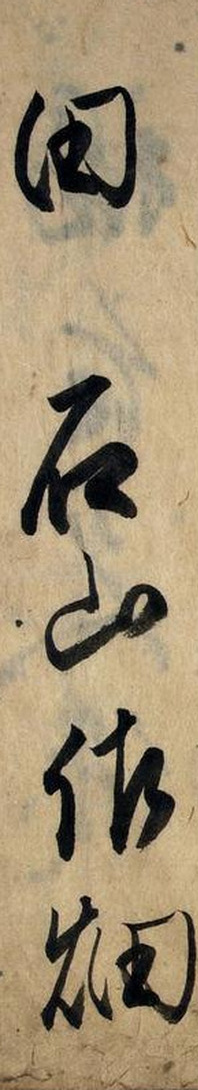田石山佐畑

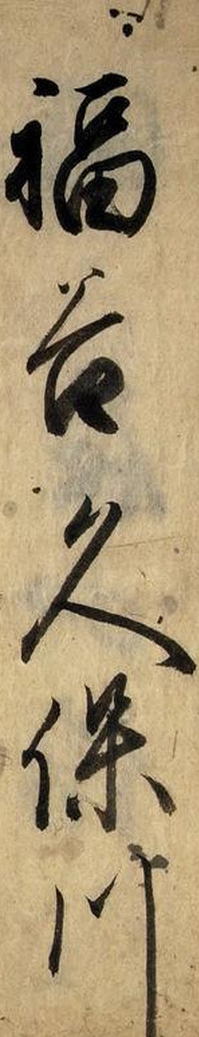福谷久保川
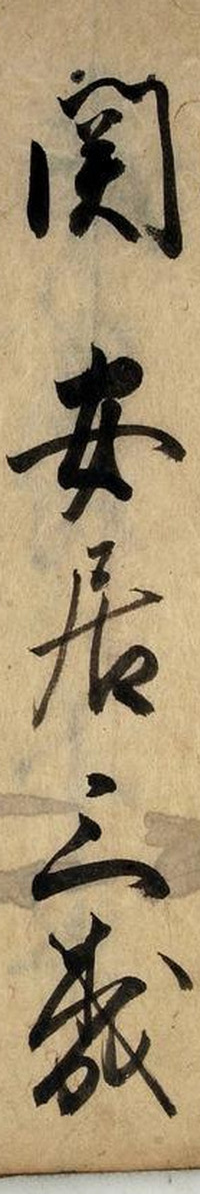関安居三森
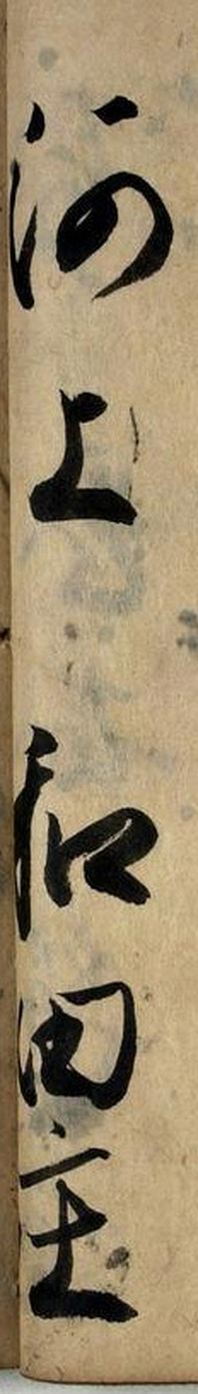河上和田庄
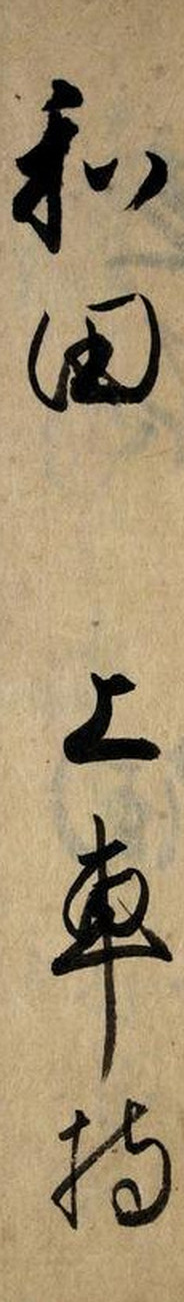和田上車持
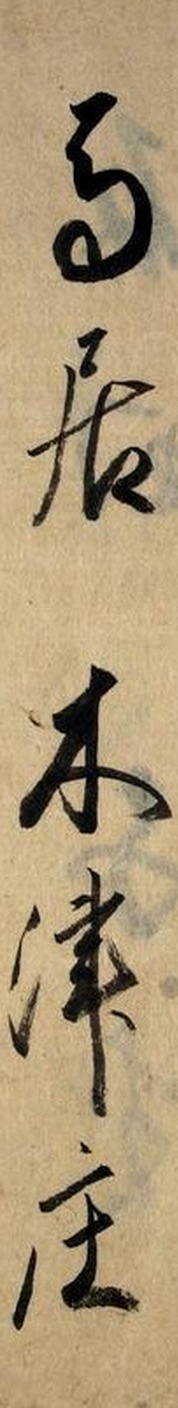馬居木津庄
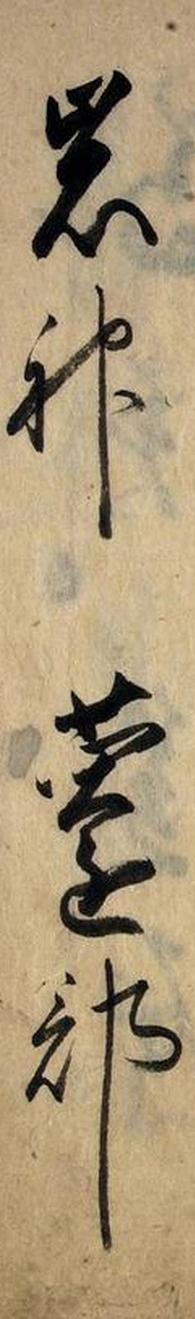岩神薗部

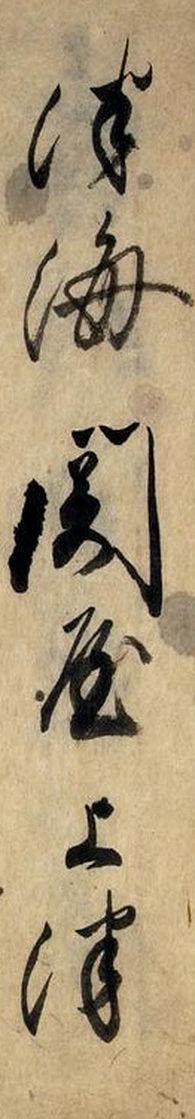津海関屋上津
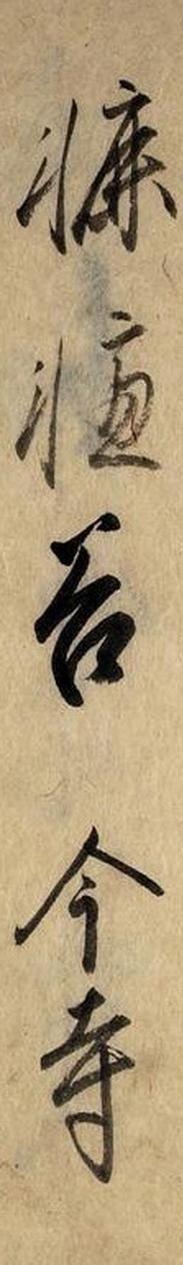轆轤谷今寺
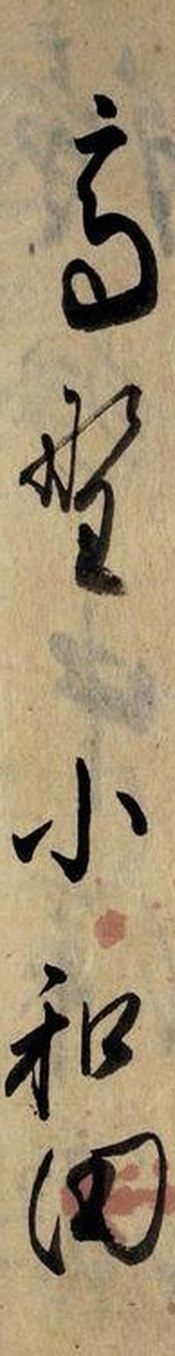高野小和田
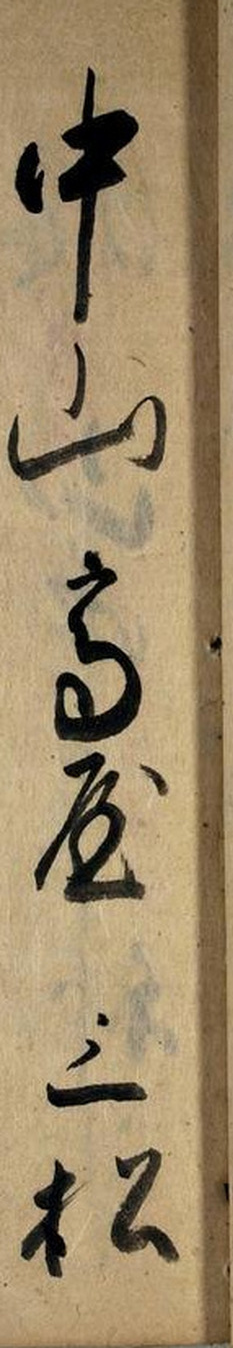中山高屋三松
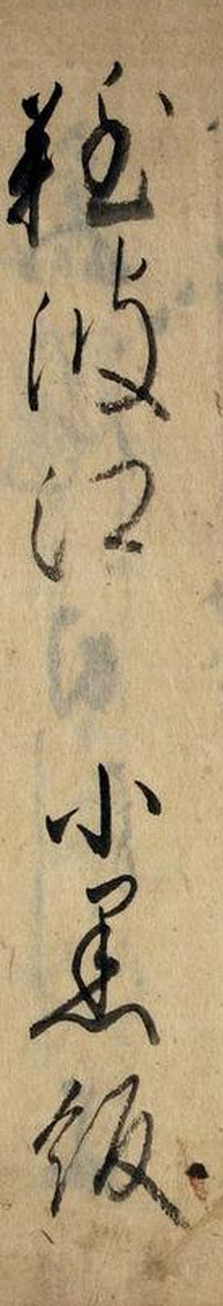難波江小黒飯
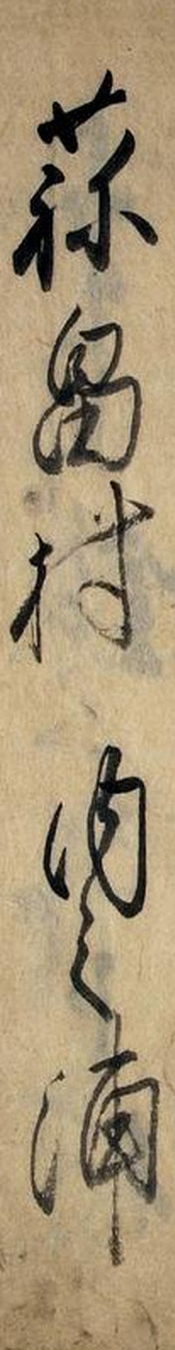蒜畠村内之浦

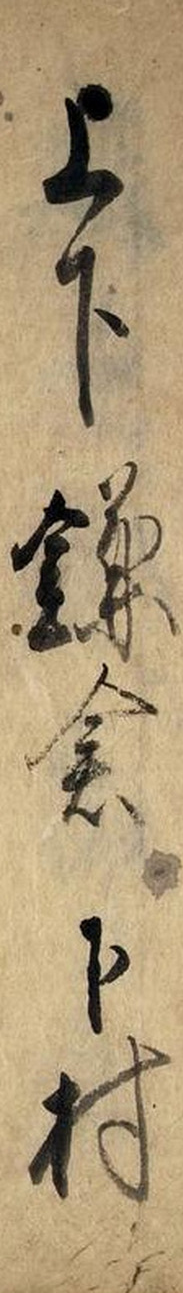上下鎌倉下村
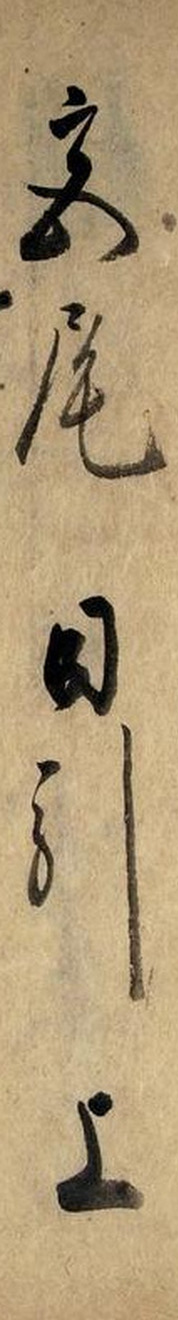宮尾日引上
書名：御手本（手習、家号之事、小浜商家の屋号）
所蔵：福井県文書館 Fukui Prefectural Archives
